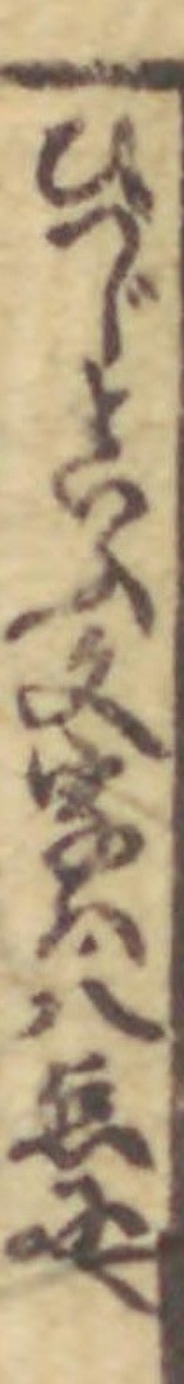ひつじといふ文字は八点に
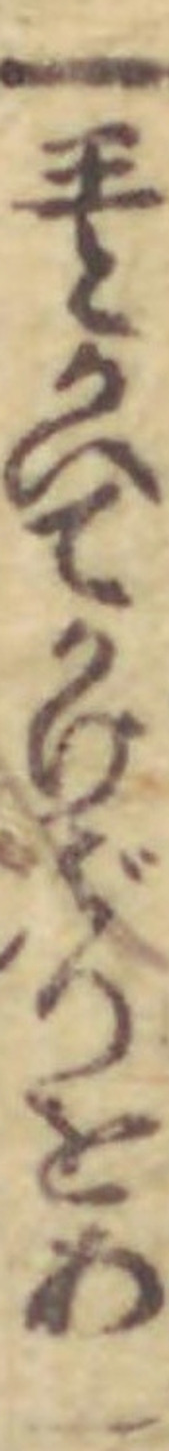王とかいてかけばりをあ
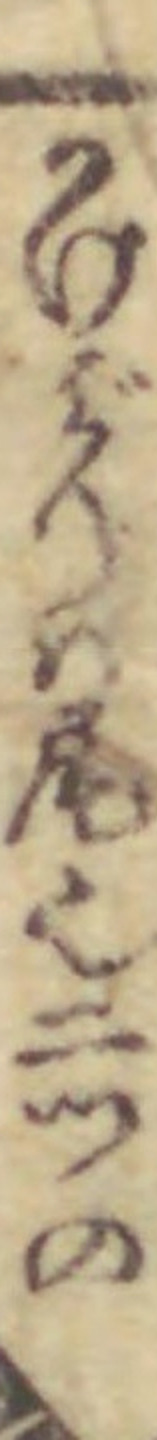かけばりは尾也二つ
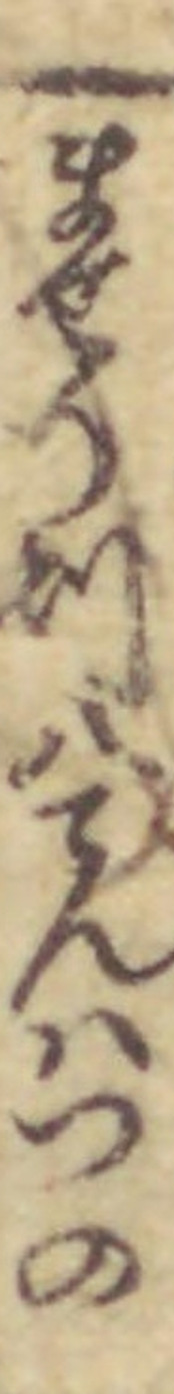ませり則八てんはつの
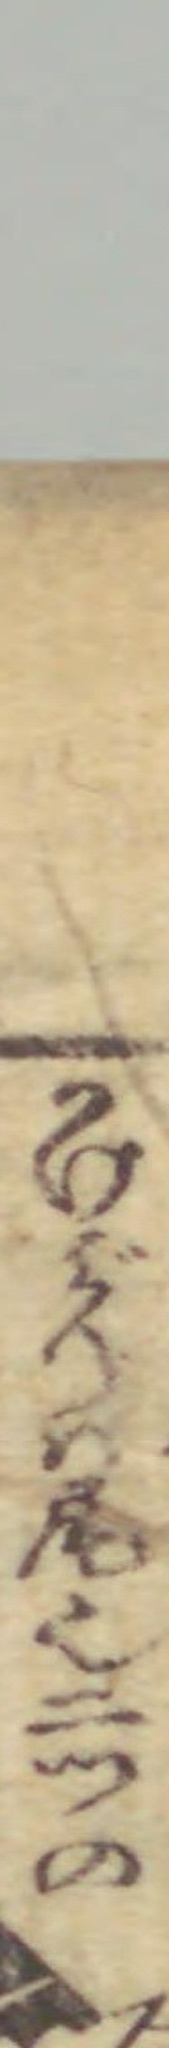かけばりは尾也二つ
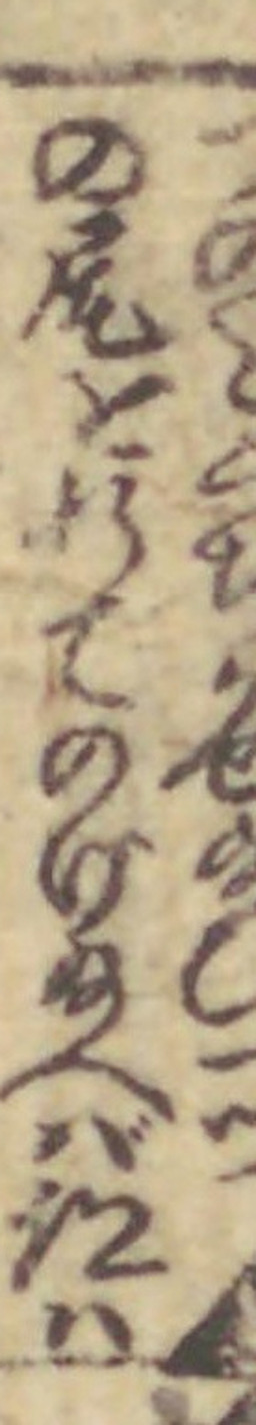の尾を折てのけ給へば跡は
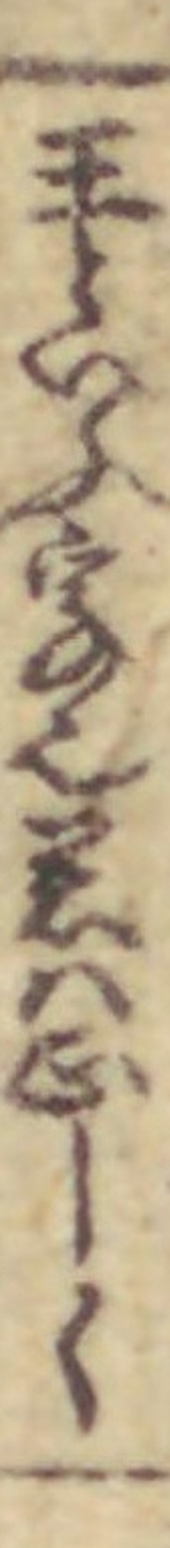王といふ字也君は正しく
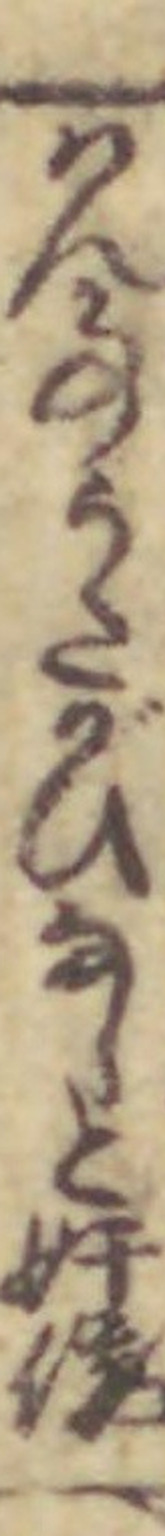はん事うたがひなしと奸佞
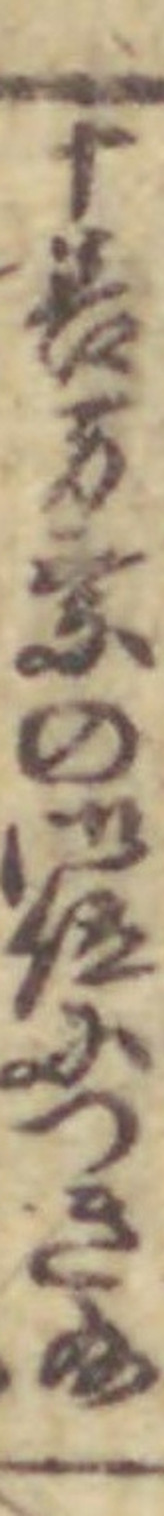十善万乗の御位につき給
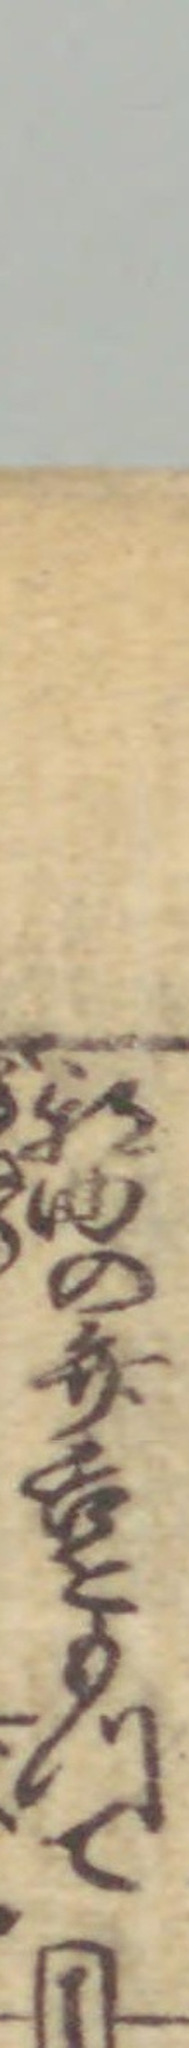朝曲の弁舌をもつて
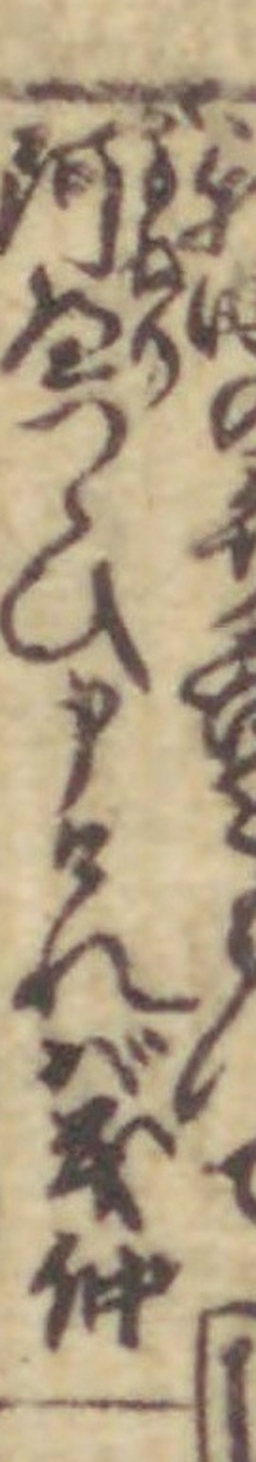阿へつらひ申ければ義仲
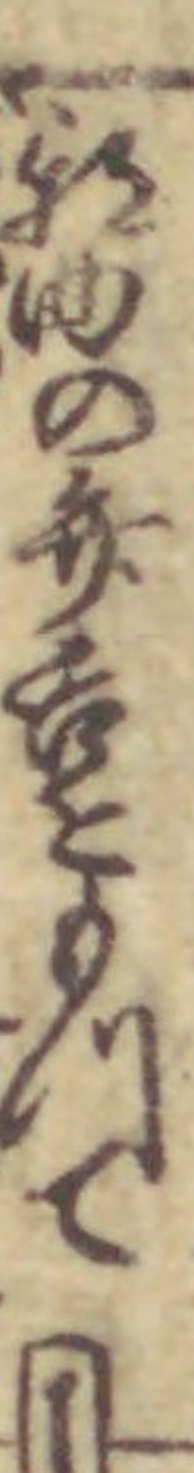朝曲の弁舌をもつて
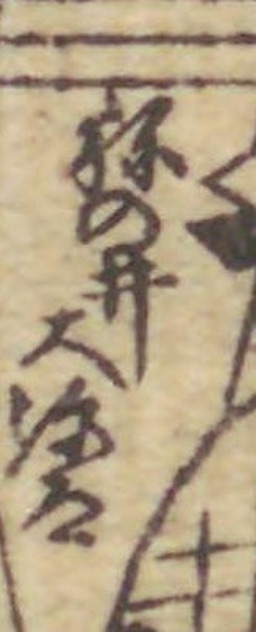ねの井大弥太

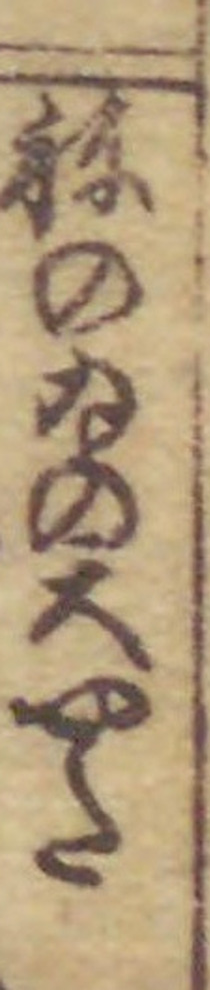ねのゐの大やた
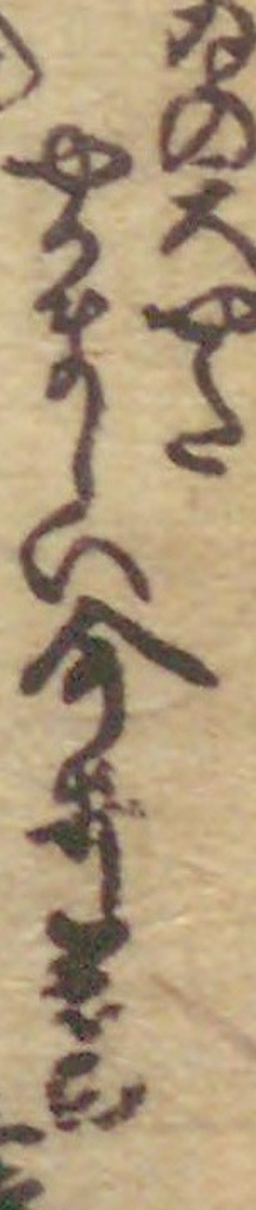やかましい今井……
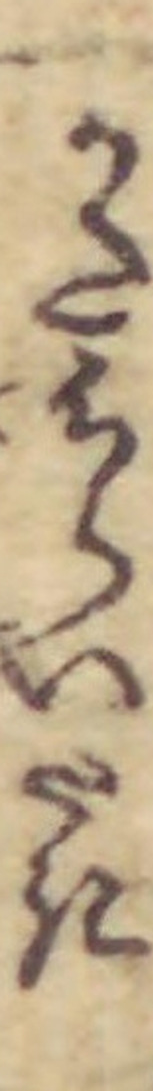かたはらいたき
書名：朝比奈草摺実記 2巻
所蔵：国立国会図書館 National Diet Library, JAPAN
